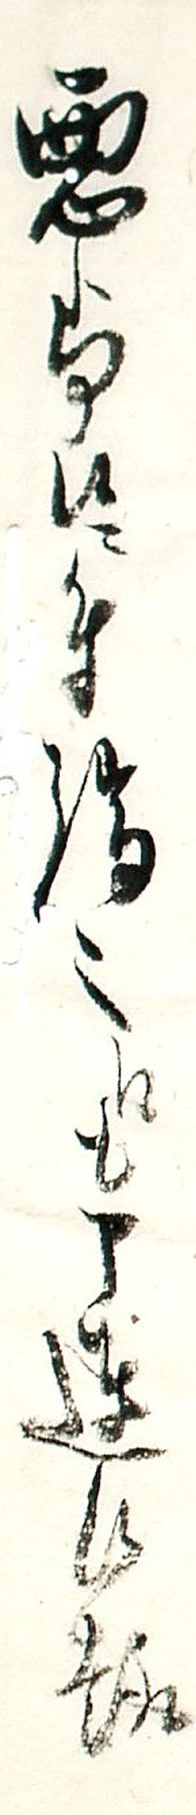悪布候に付端々えも申達候趣
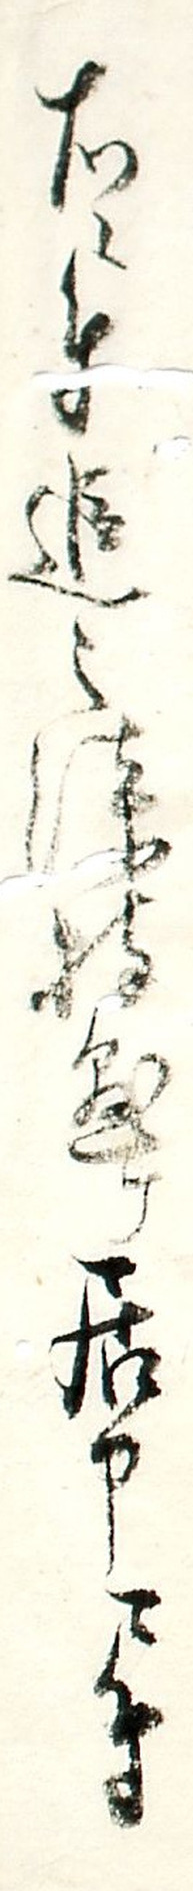右に付追々漆持懸け居申に付
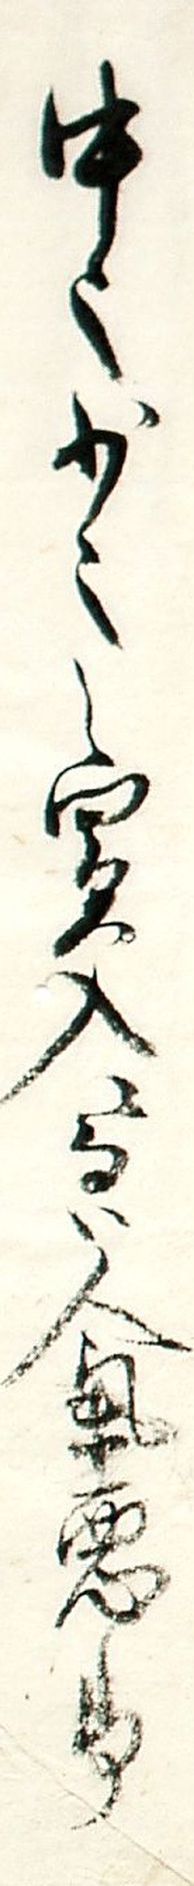中々少々の買入に而は人気悪布
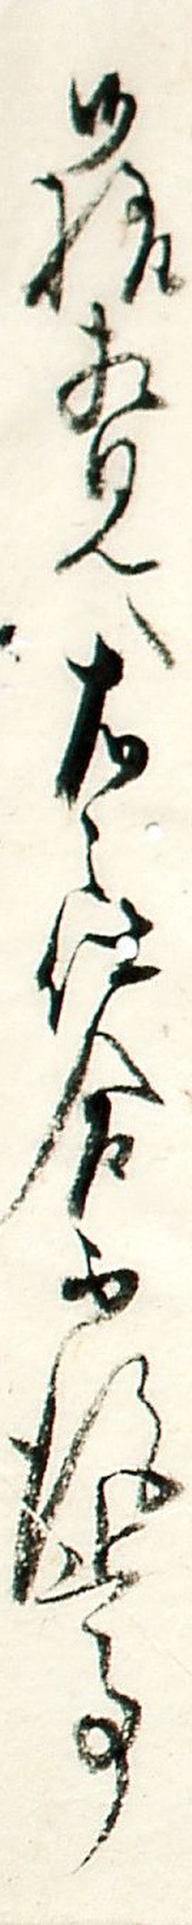候様相見へ右之仕合不得止事
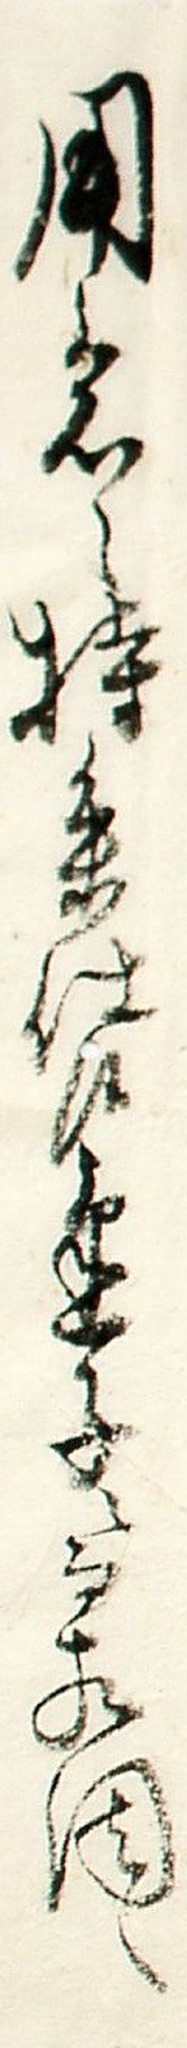用意之持参仕候金子に而相調へ
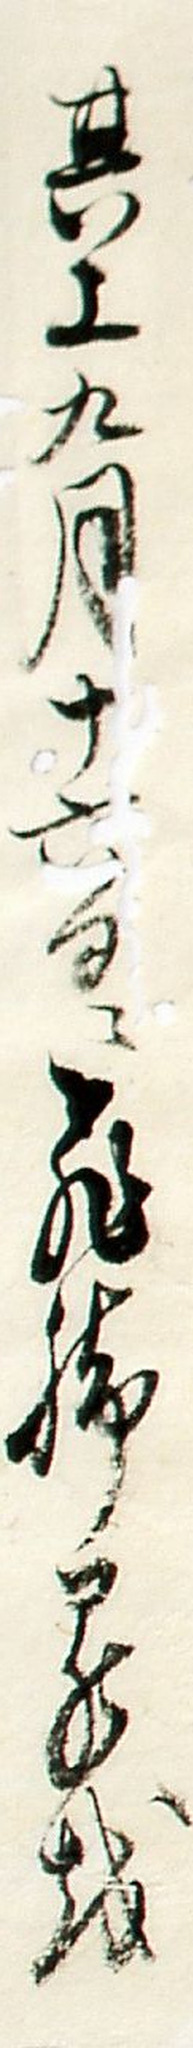其上九月十六日に飛脚罷越
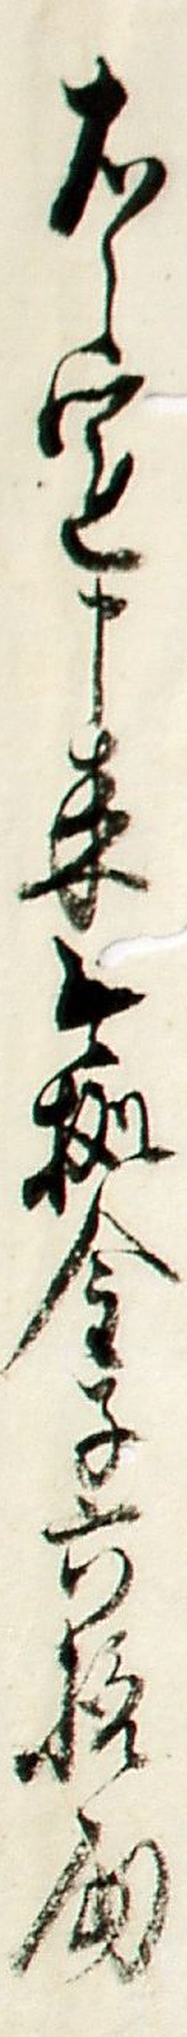右之運申来無拠金子六拾両
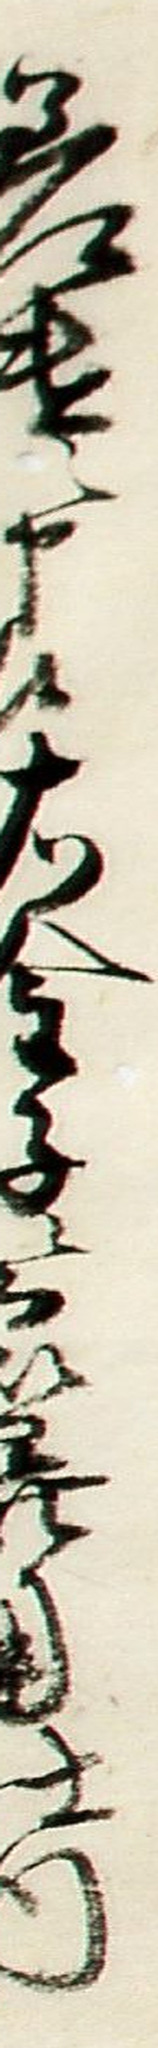差遣申候右金子に而算用仕内

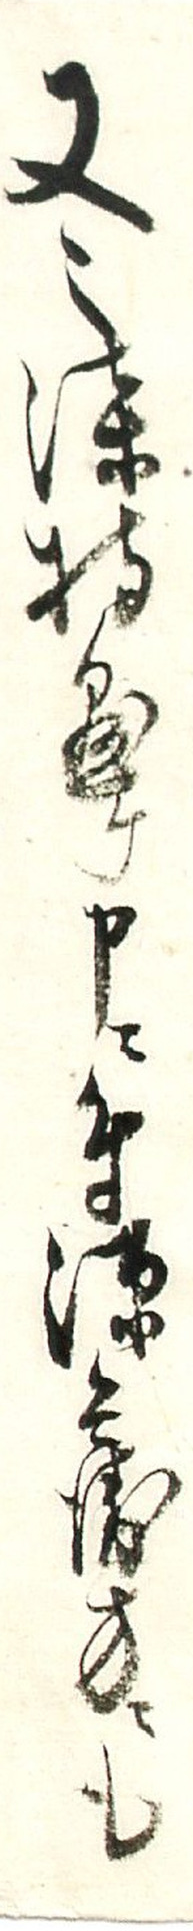又々漆持懸け申に付源兵衛方にも
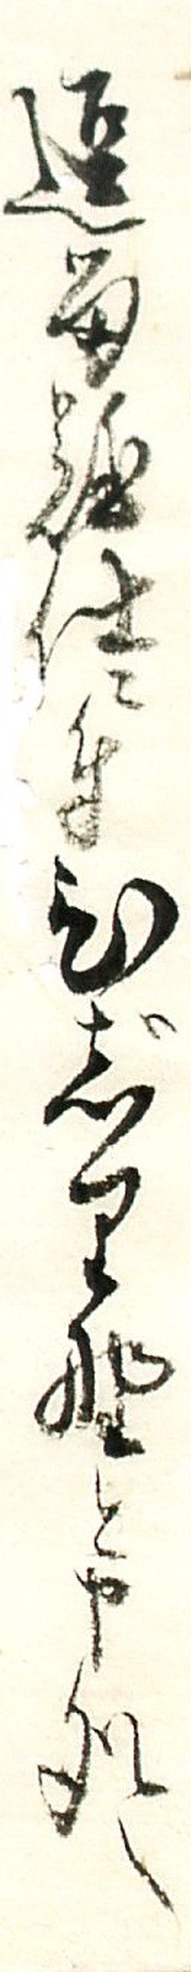逗留難仕に付ひじり野と申処へ
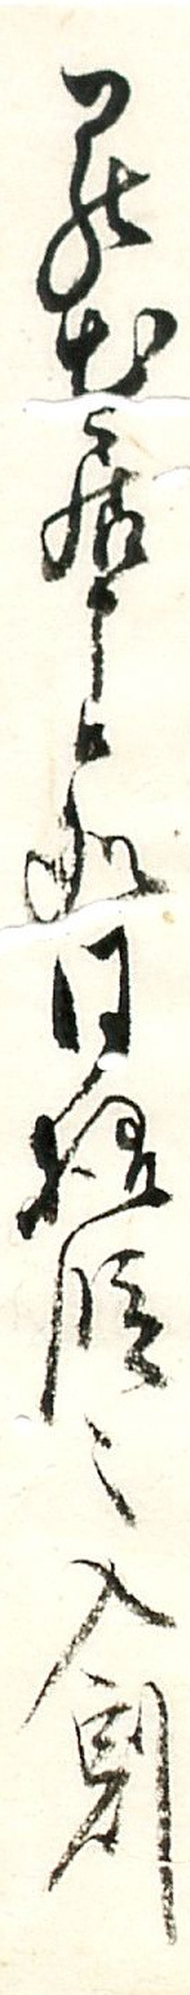罷出居申候処同様段々入割
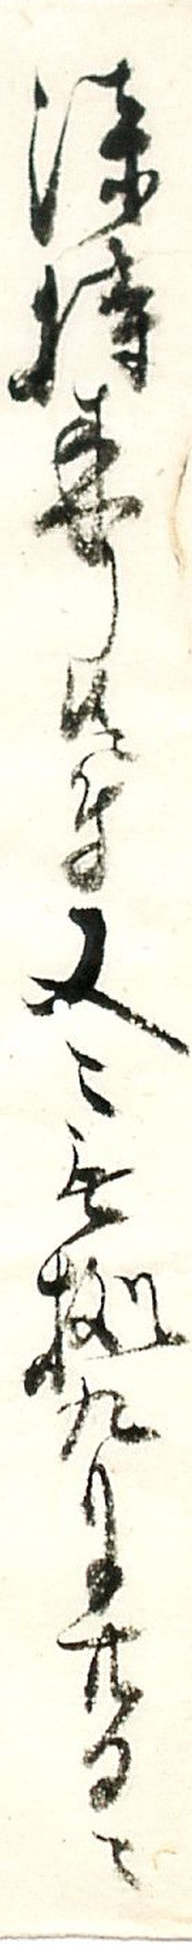漆持来り候に付又々無拠九月廿日に
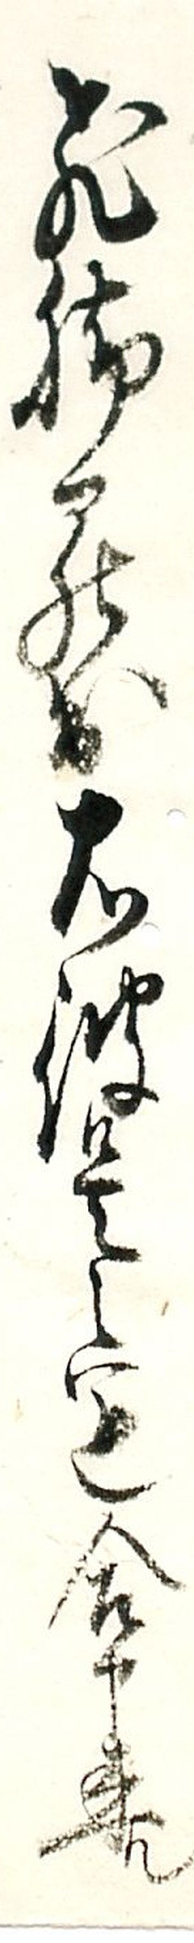飛脚罷出右彼是之運合申来る
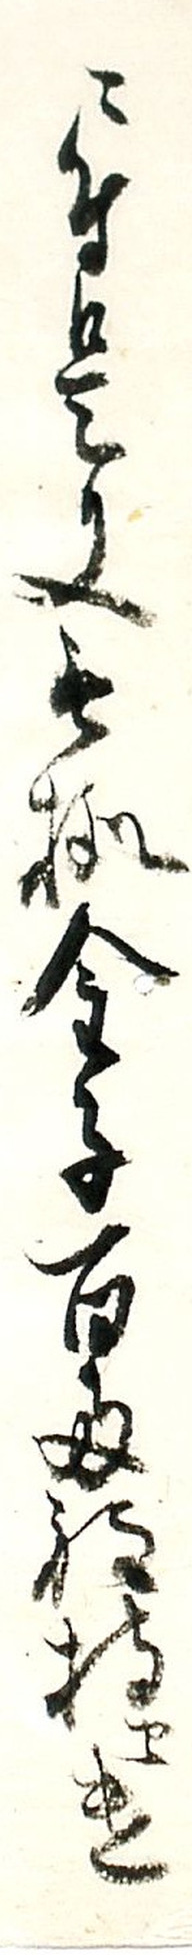に付是又無拠金子百両程持せ遣
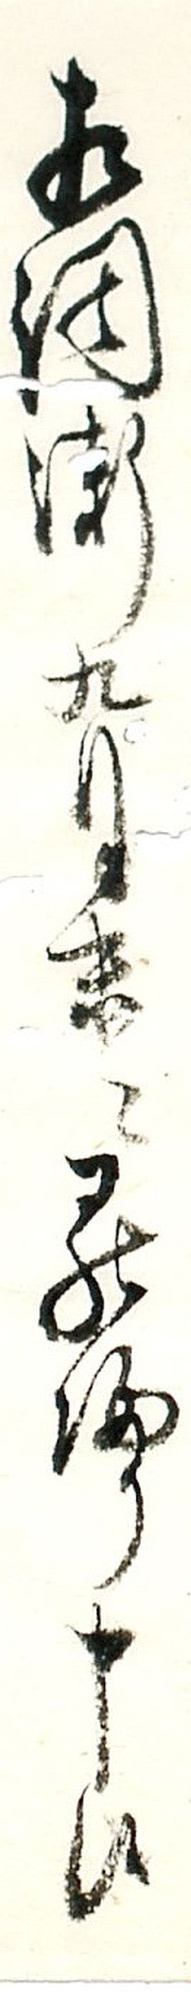相調漸九月末に罷帰り申候
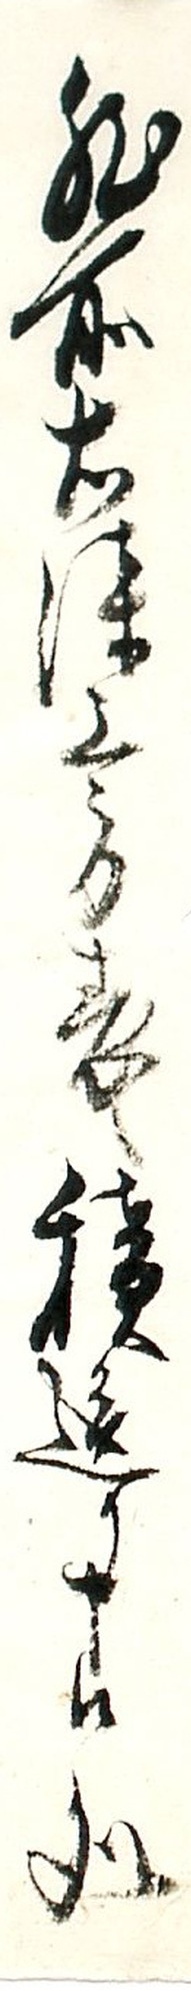然所右漆上方表へ積送り申候処
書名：乍恐横切ヲ以奉申上覚（山城谷漆買入銀一件ニ付）
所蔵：鳴門教育大学 Naruto University of Education
